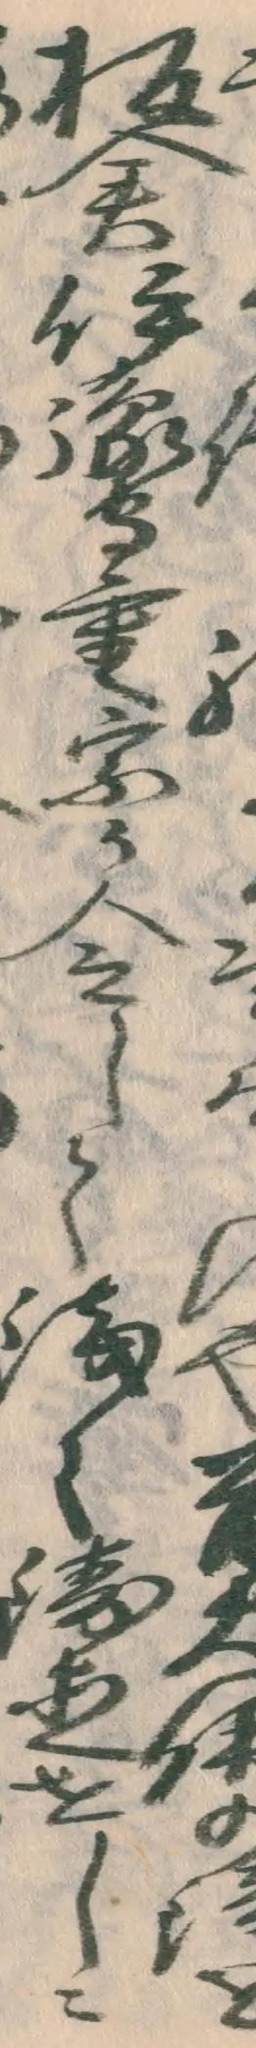板倉伊豫守重宗か令して銭に鋳直せしニ
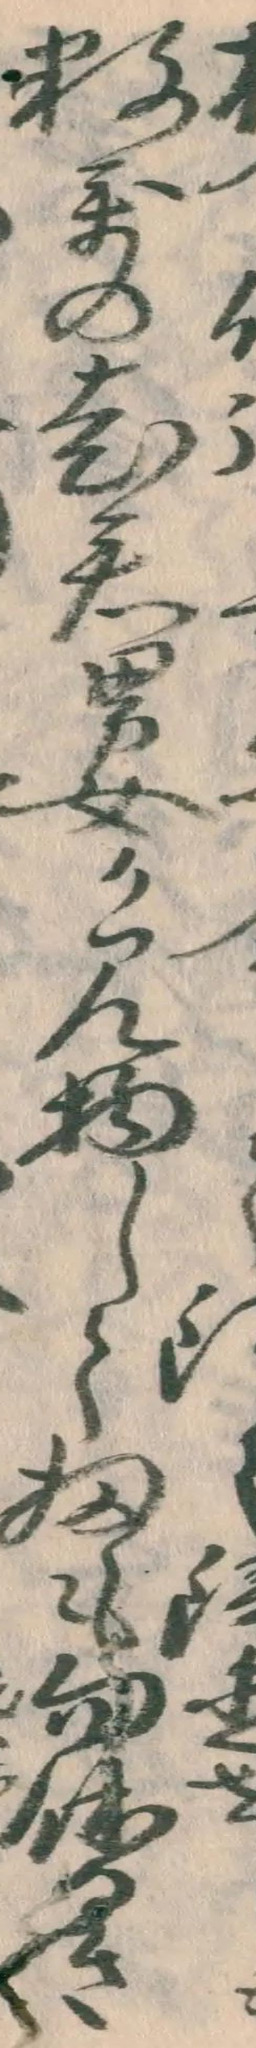数萬の老若男女か見物して扠も勿体なき
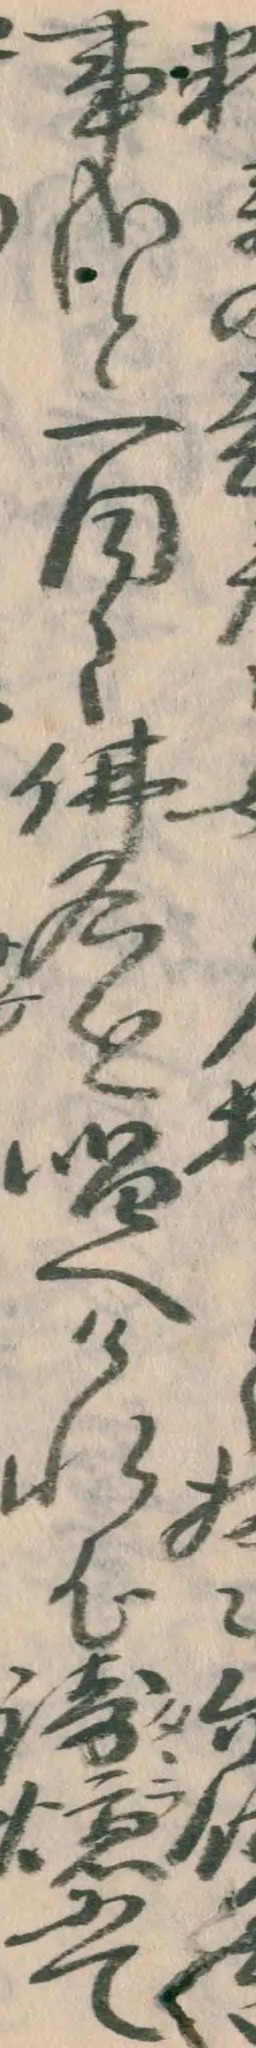事哉と一同に佛名を唱へければ鋳爐にて
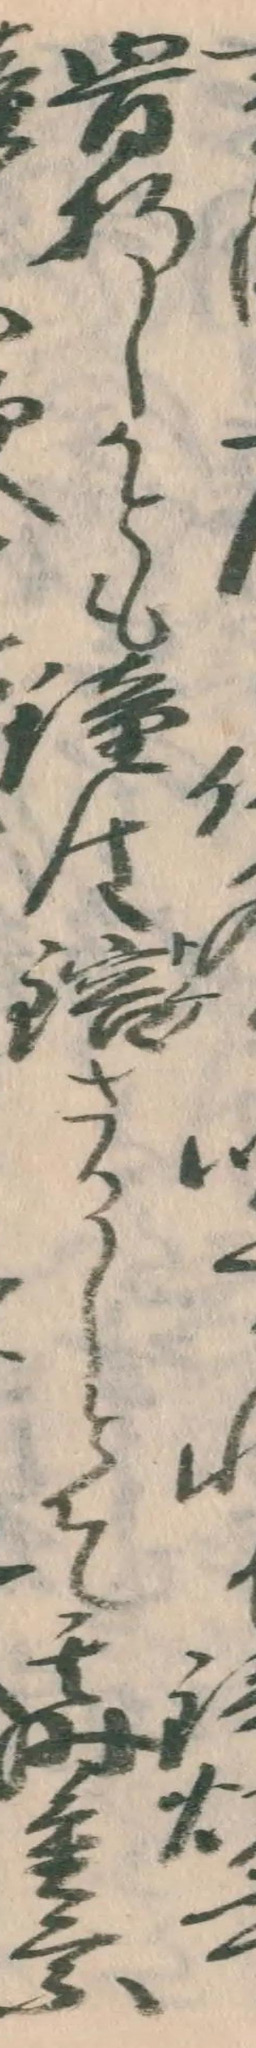骨折しても鐘は鎔さりしとて其時重宗
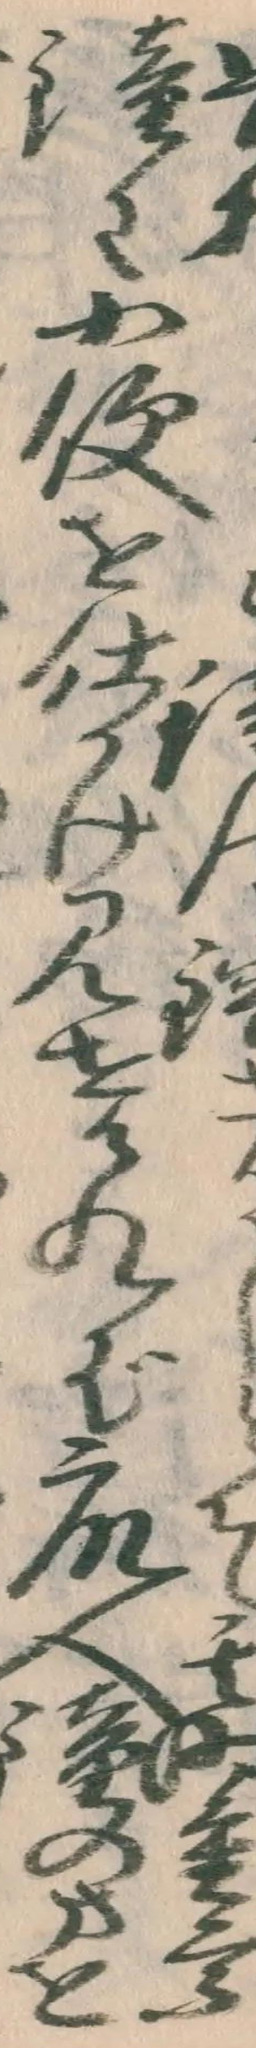鐘に小便を仕かけ見せければ衆人鐘の方を
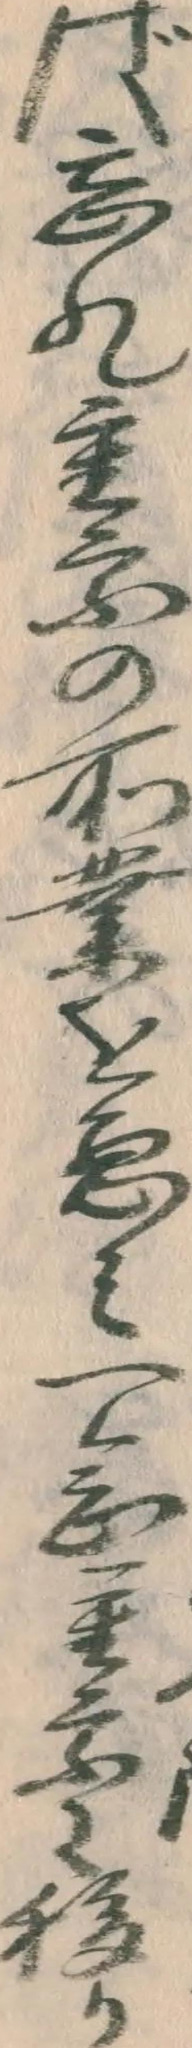ば忘れ重宗の所業を悪ミ一念重宗ニ移り
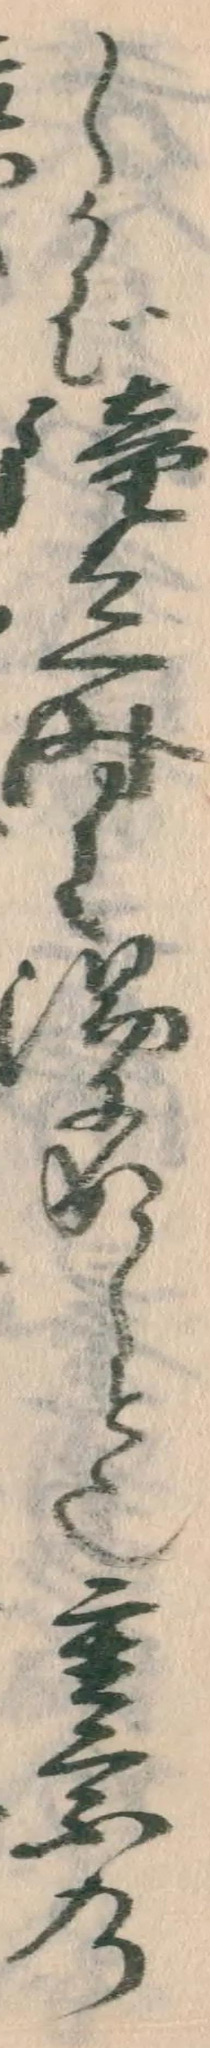しかば鐘は一時に湯に成しと也重宗の
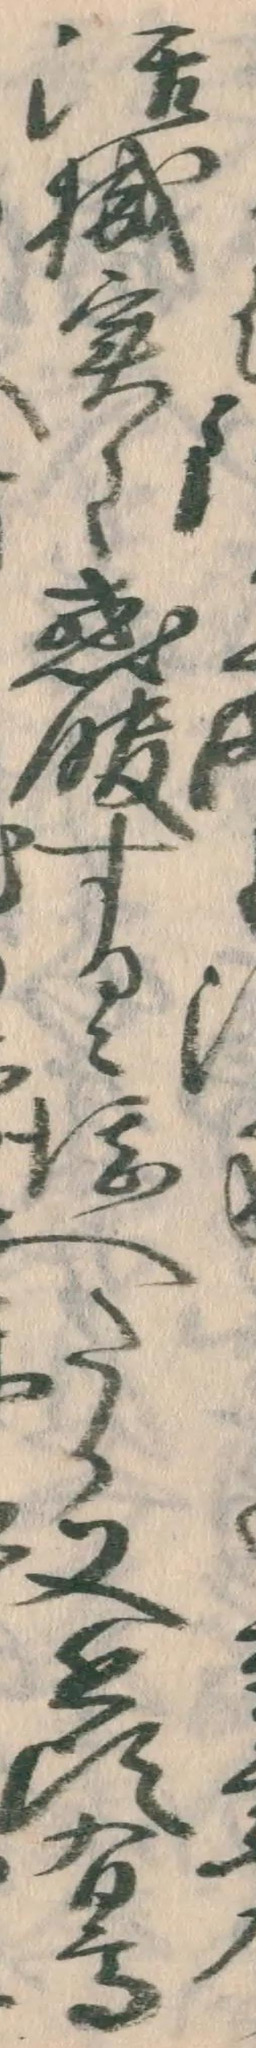活機実に感服するニ堪へたり又近頃有高
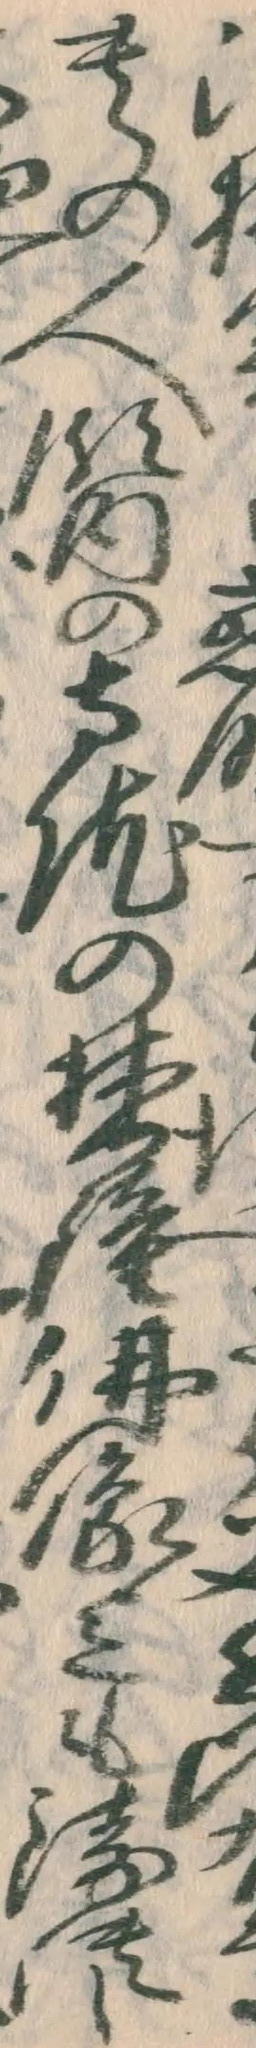貴の人領内の寺院の梵鐘佛像迄も鋳潰し
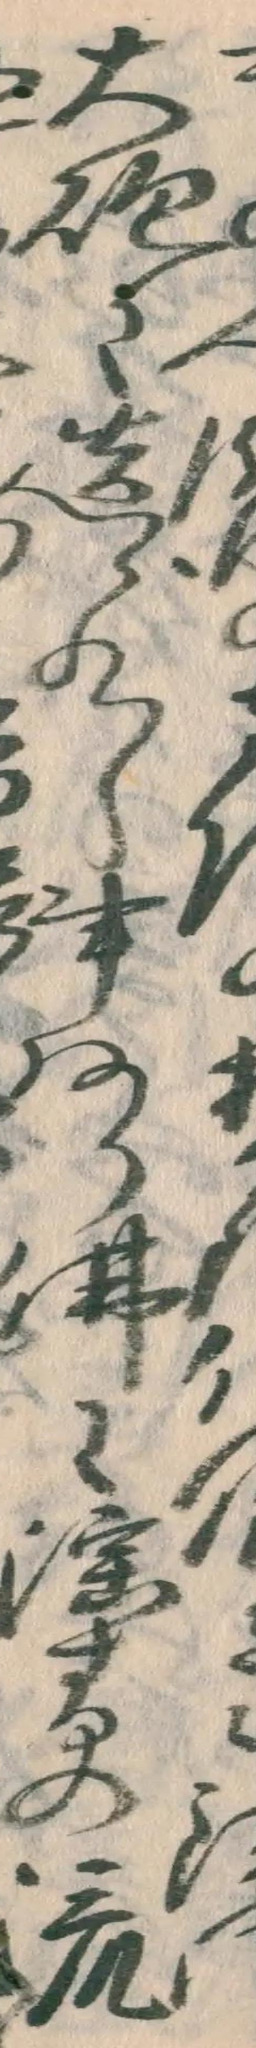大砲に造られし事あり佛に淫するの流
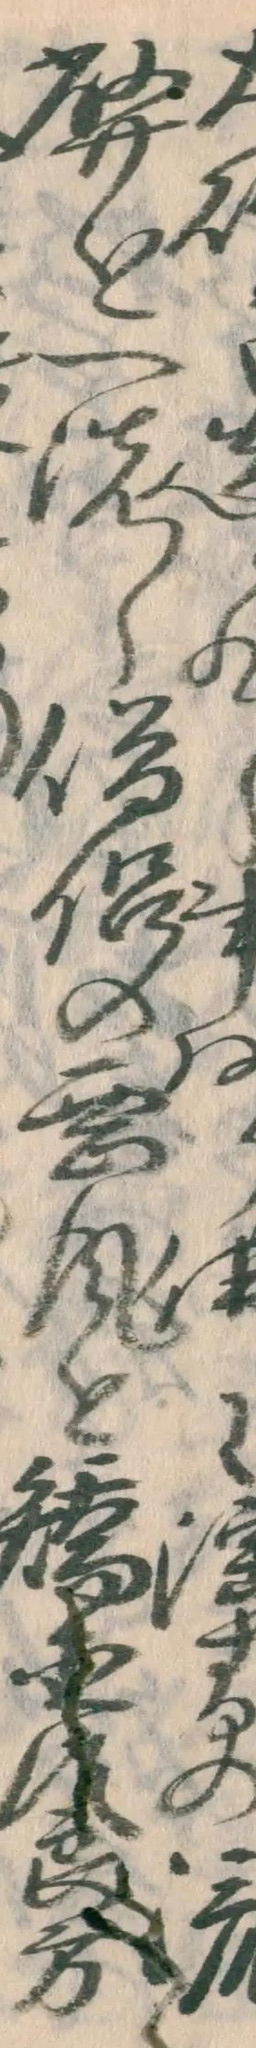弊を一洗し僧侶の悪風を矯直す良方
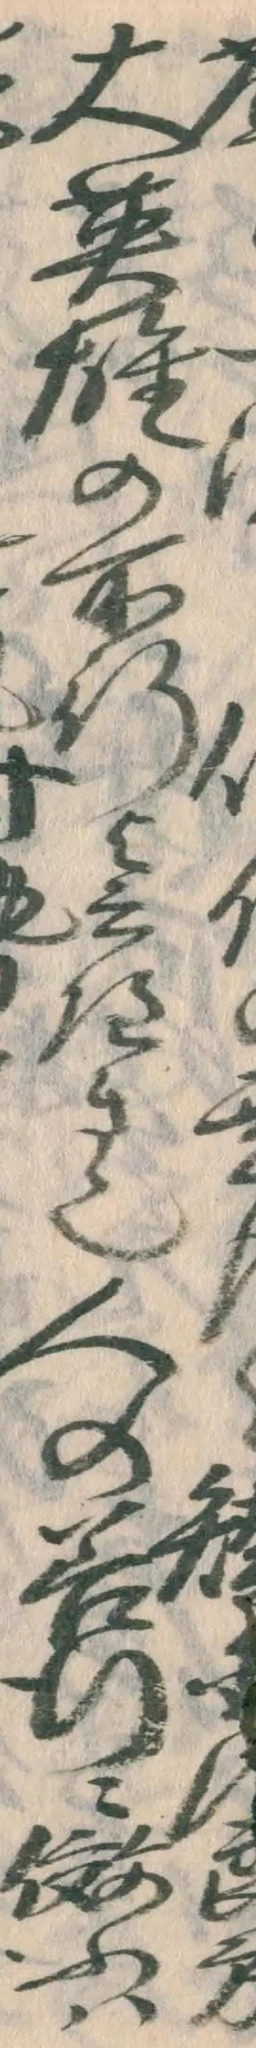大英雄の所業と云へき也人の善行ニ倣ふハ
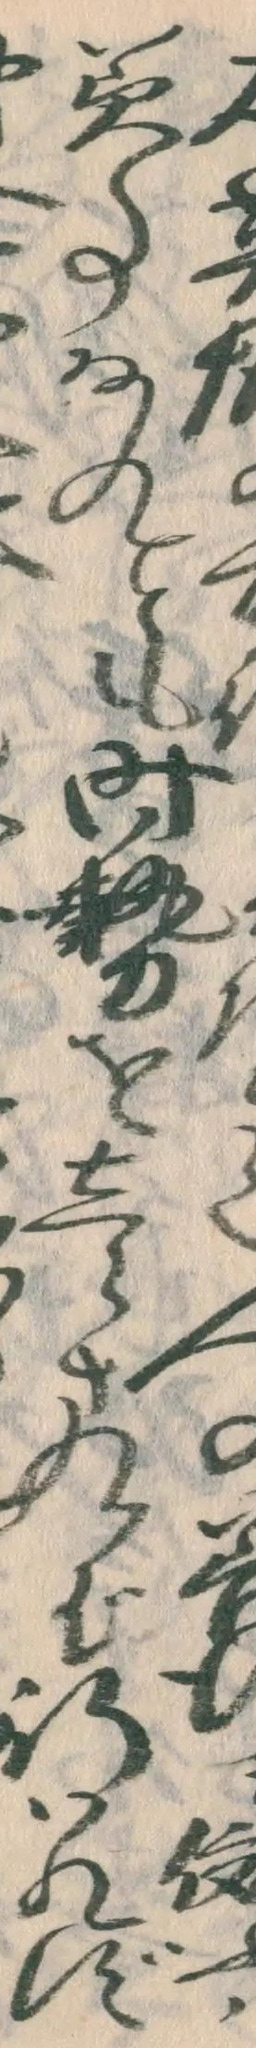美事なれとも時勢をしらされば行ハれず
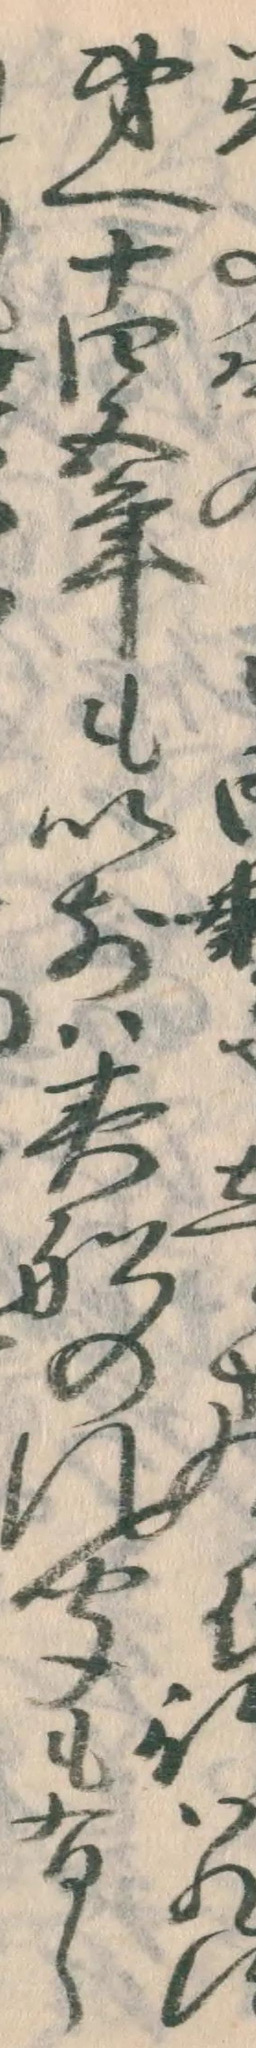第一十四五年も以前ハ夷船の風聞も有し
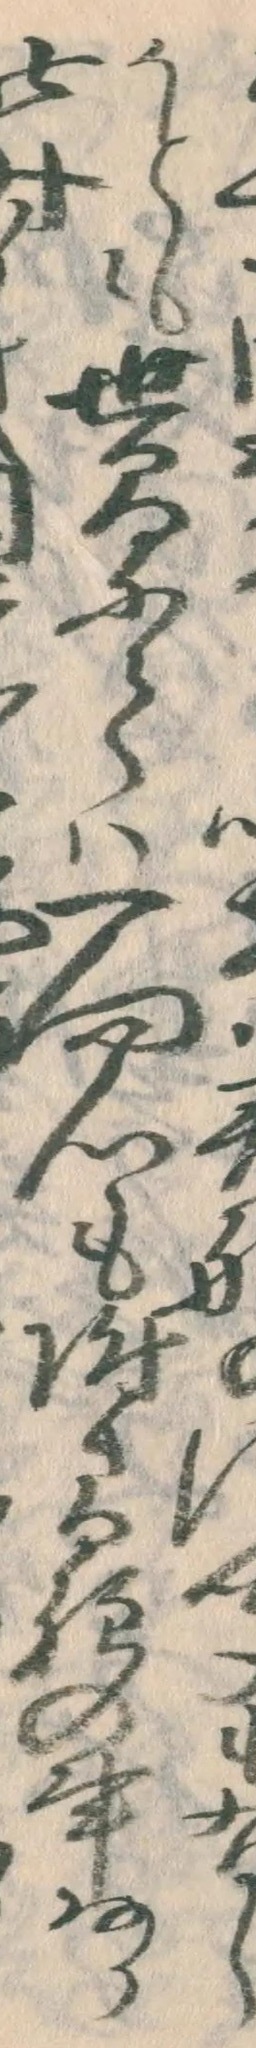かとも世間にてハ一向心も附さる程の事なり
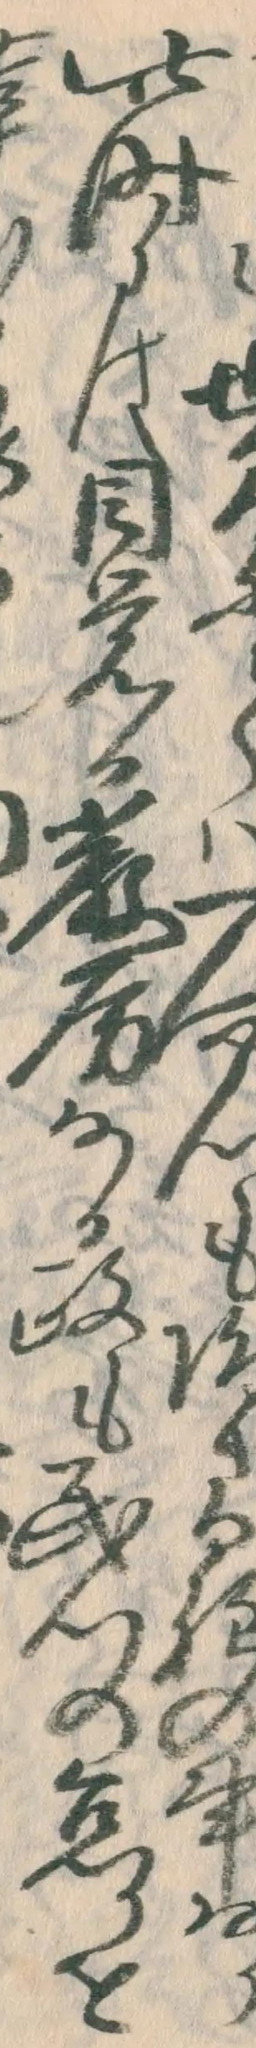此時には目覚る厳厲なる政も民心の怠りを
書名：麗斎叢書. 20
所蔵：国立国会図書館 National Diet Library, JAPAN
